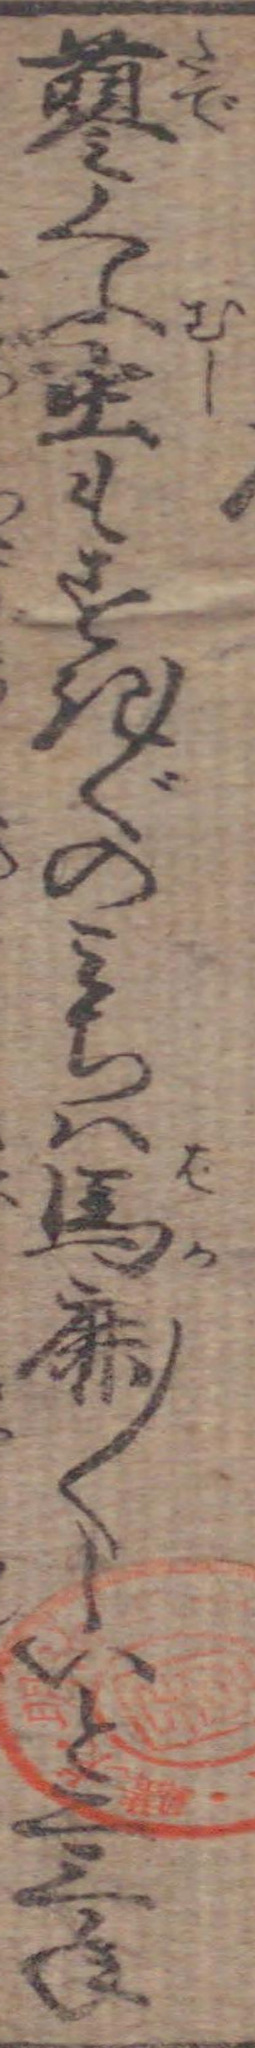蓼くふ虫もすき〴〵のみちは馬鹿〳〵しいと二三年
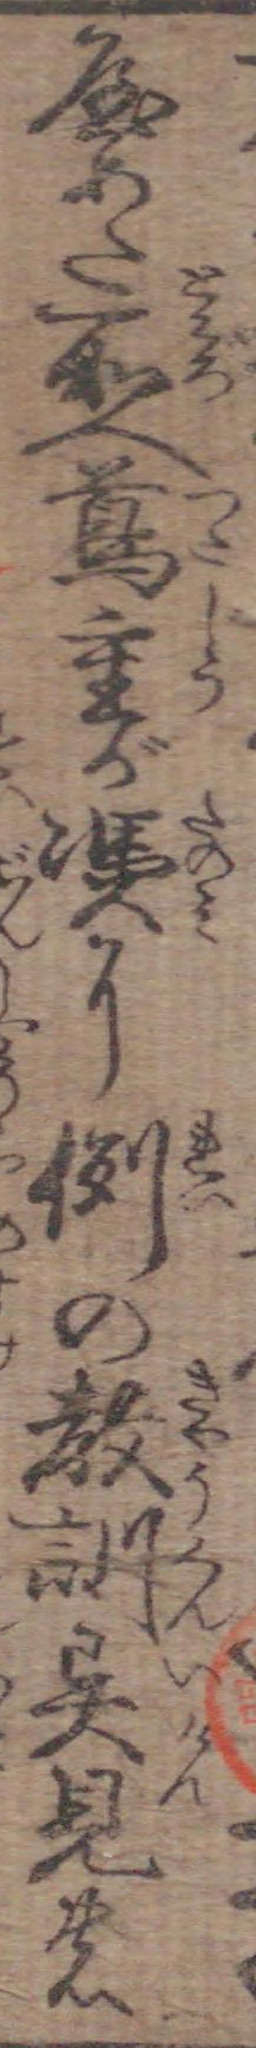やめた所へ蔦重が憑に例の教訓異見の
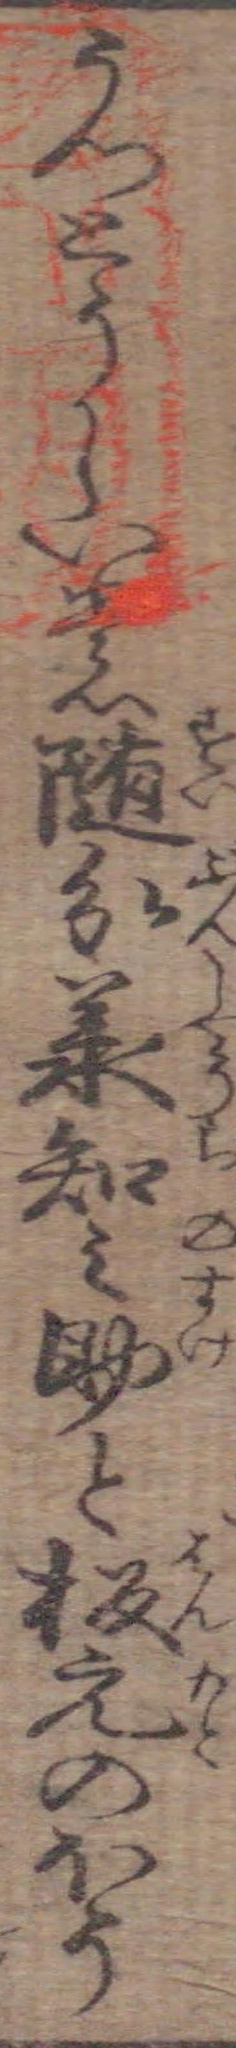うつとうしいも随分承知之助と板元のほう
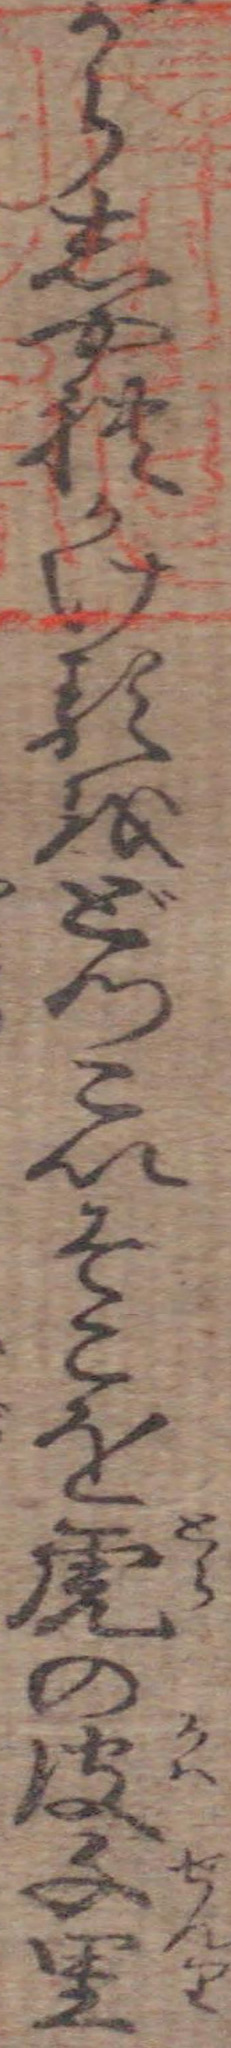からしやれかけるをどつこいそこを虎の皮千里
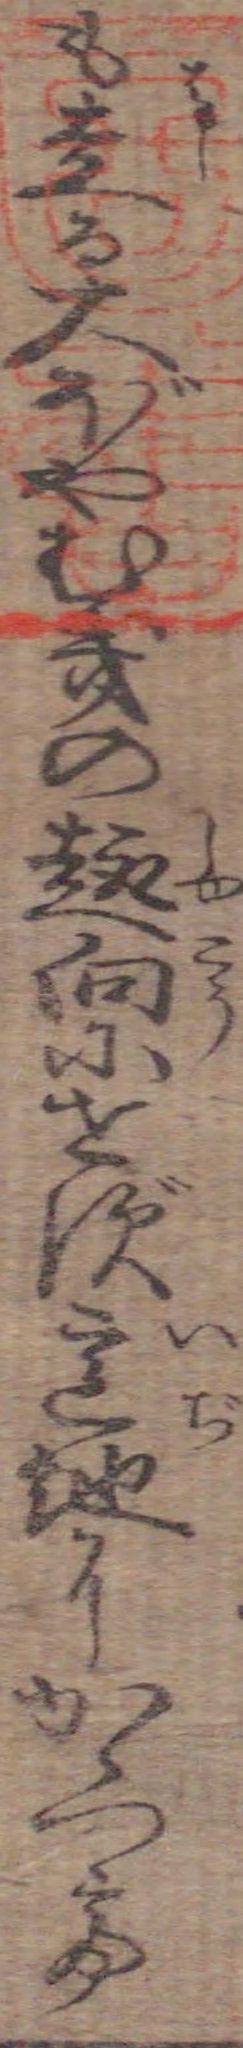も走る大ぼやむきの趣向にせず意地にかゝつて
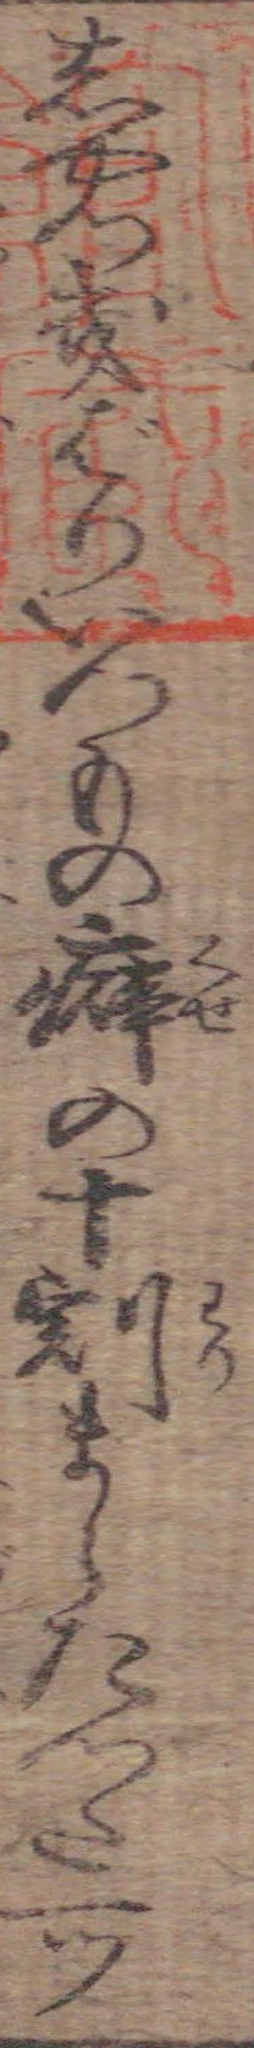しやつきばりいつもの癖の十割ましたつた一つ
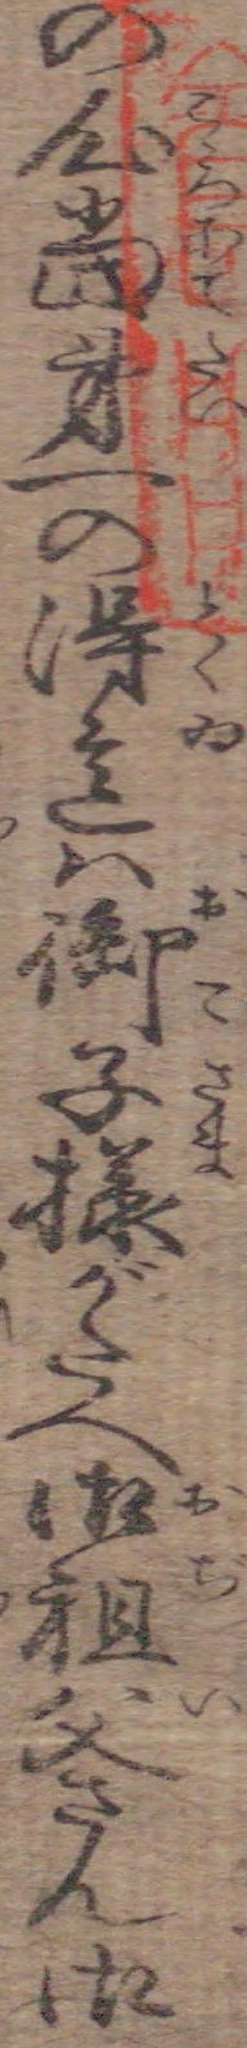の心当第一の得意は御子様がたへ御祖父さん御
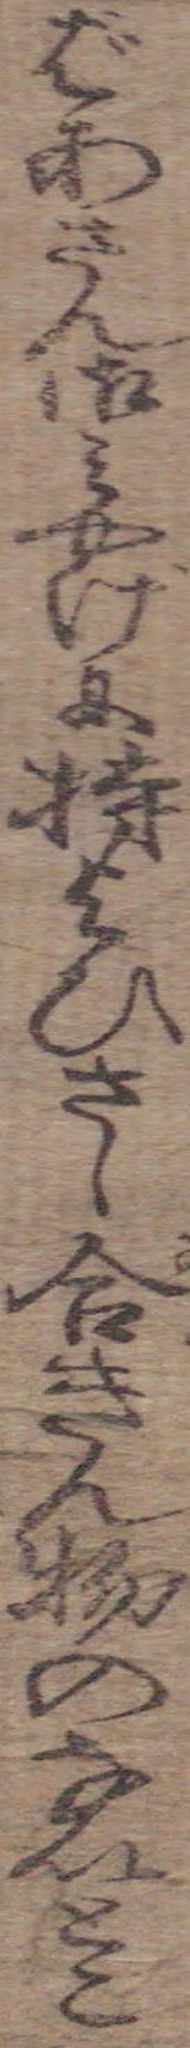ばあさん御みやげに持よひさし合きん物のないとこ
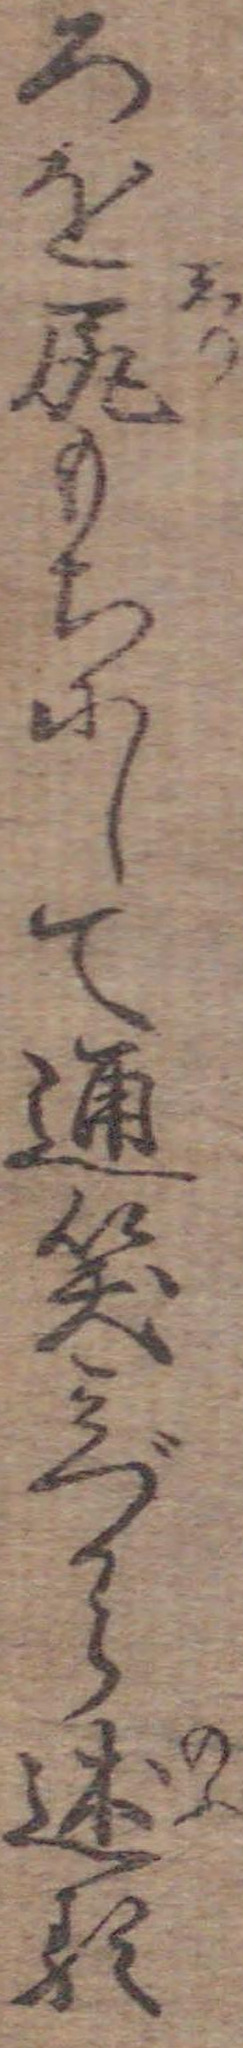ろを尻もちにして通笑みづから述る

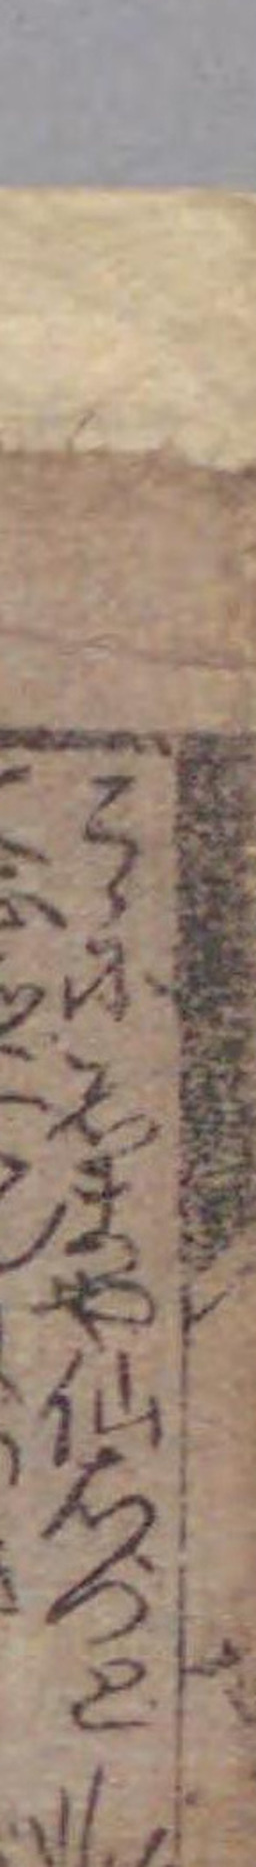こゝにしまや仙右衛門と
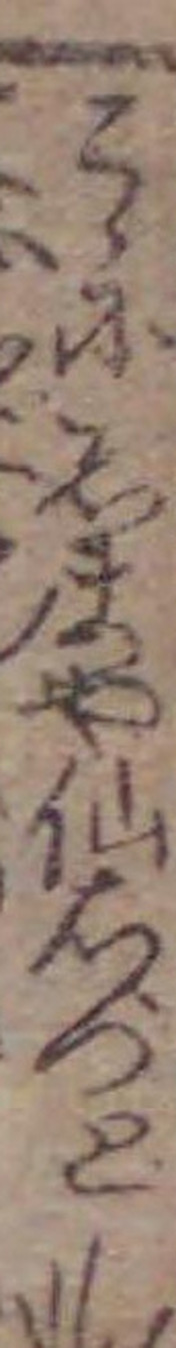こゝにしまや仙右衛門と
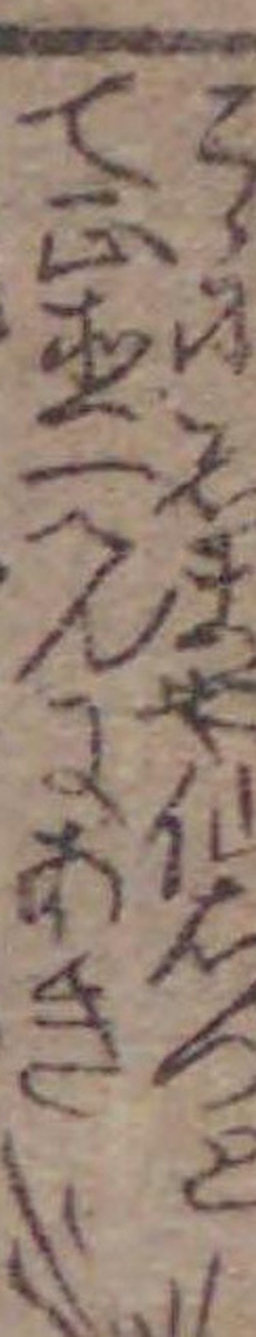て正直一へんにあき
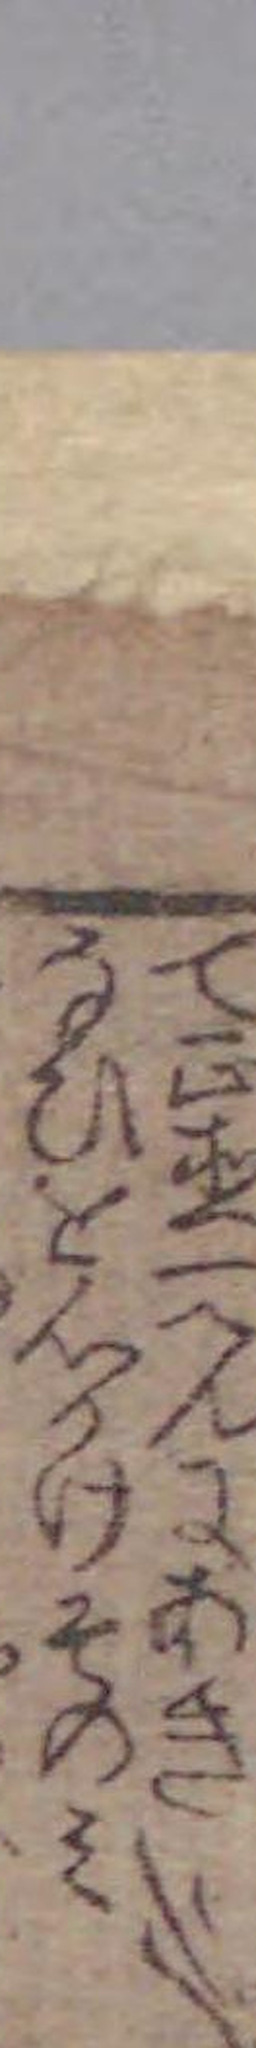なひを心かけそのみ
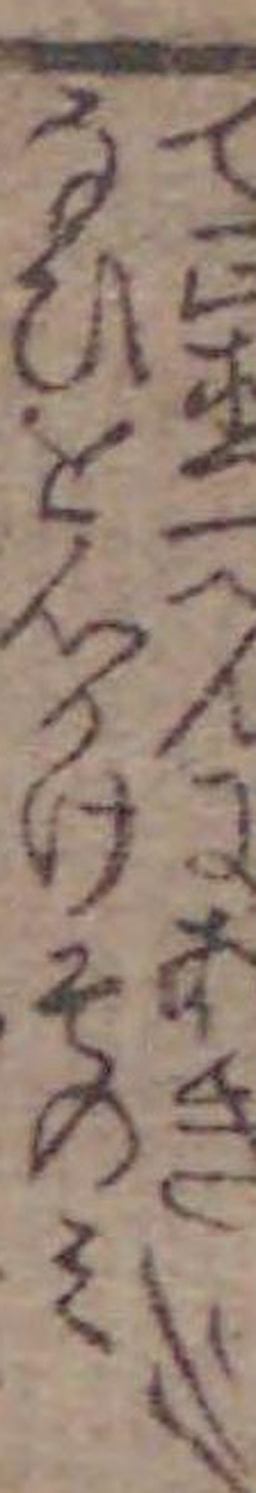なひを心かけそのみ
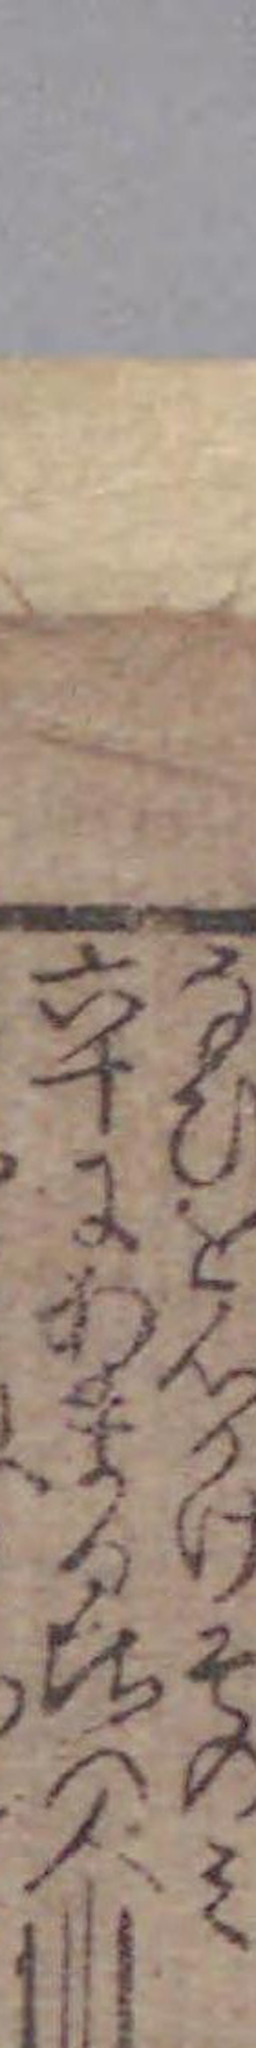六十にあまる比は人
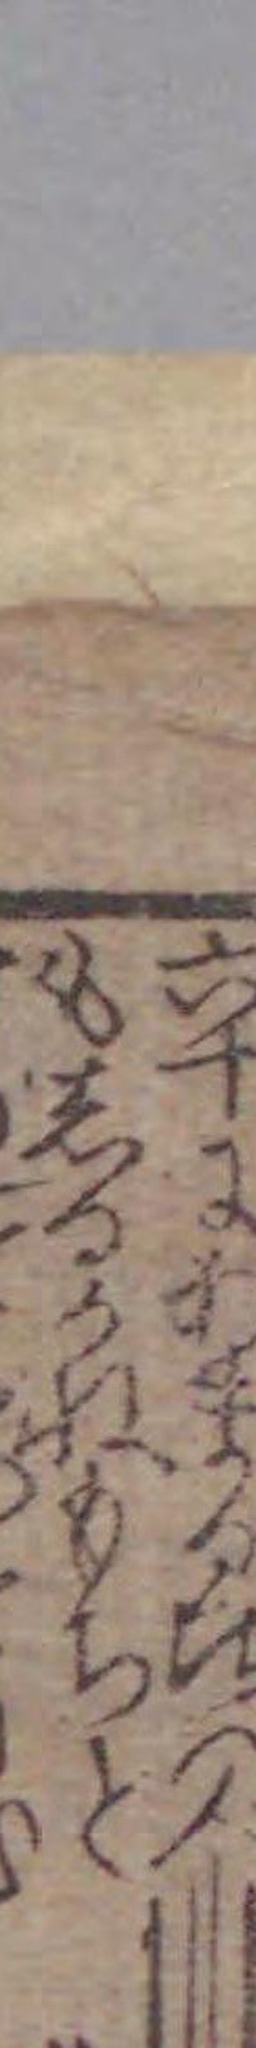もしるかねもちと
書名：即席耳学問 : 3巻
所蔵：国立国会図書館 National Diet Library, JAPAN
